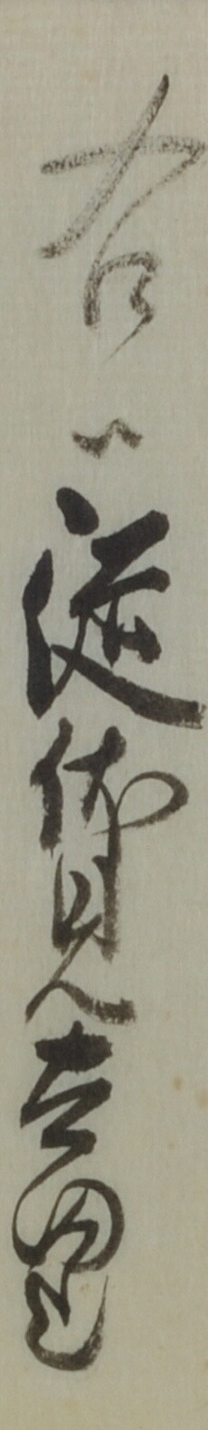右ハ従伏見太田迄

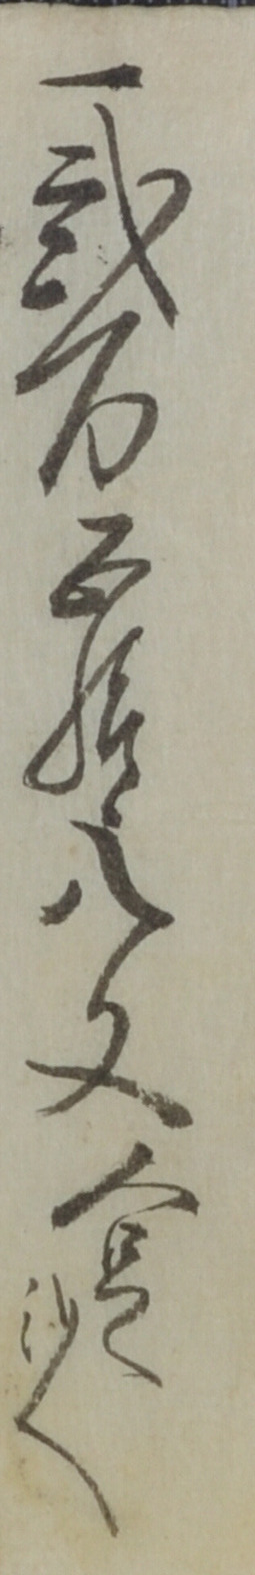一弐百五拾八文人足弐人
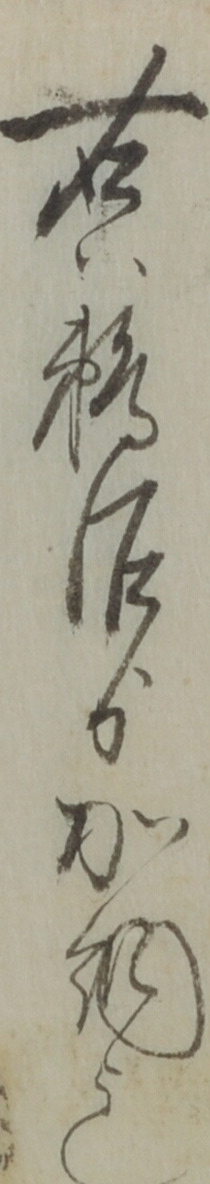右ハ鵜沼より加納迄
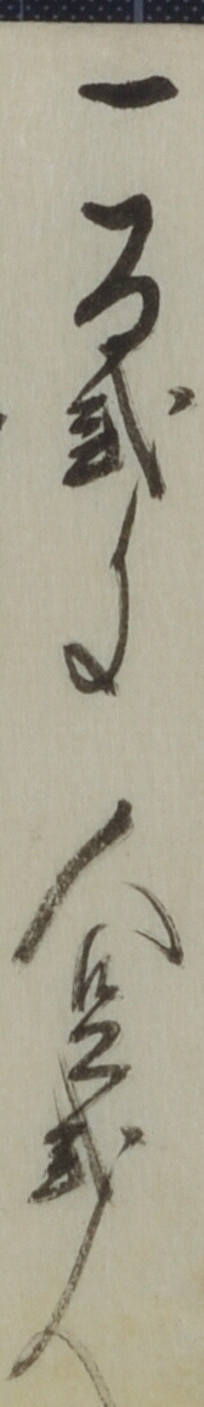一百弐文人足弐人
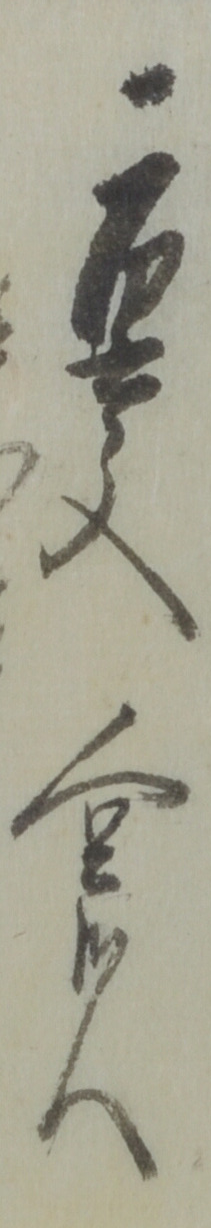一百六文人足弐人

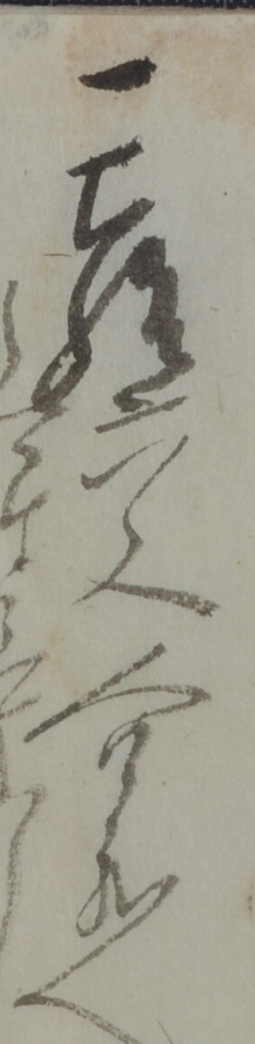一七拾六文人足弐人
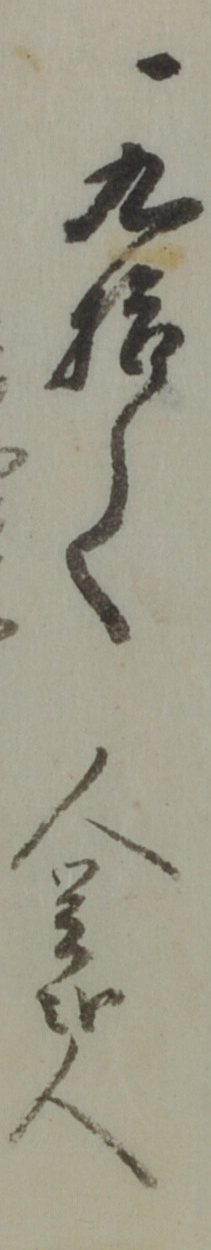一九拾文人足弐人
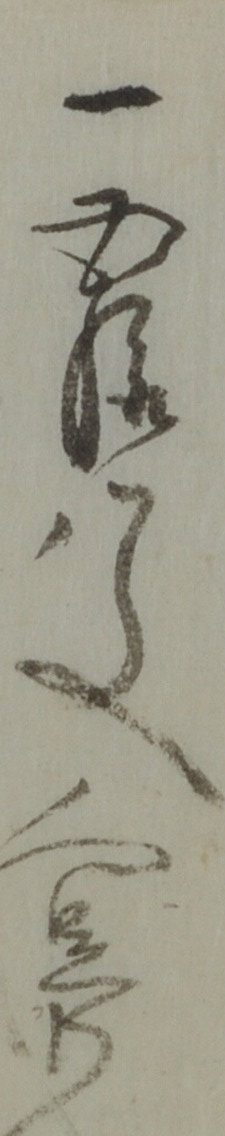一五拾八文人足弐人
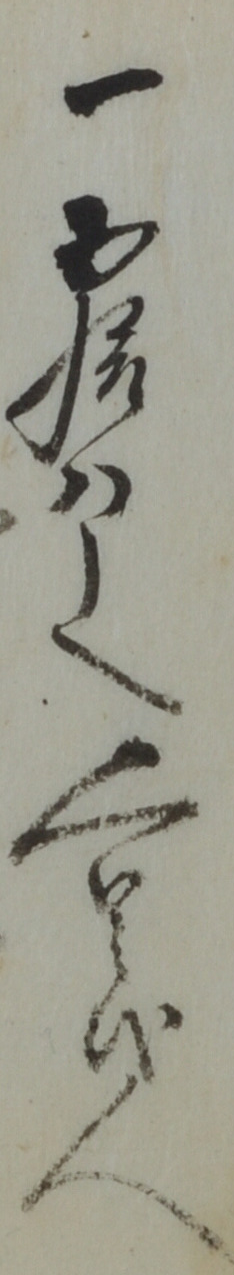一五拾八文人足弐人

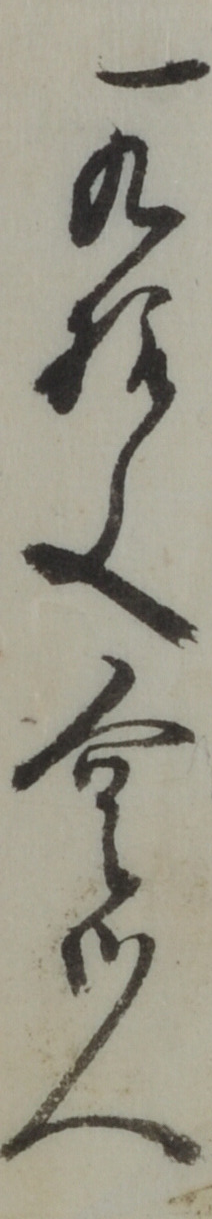一九拾文金弐人
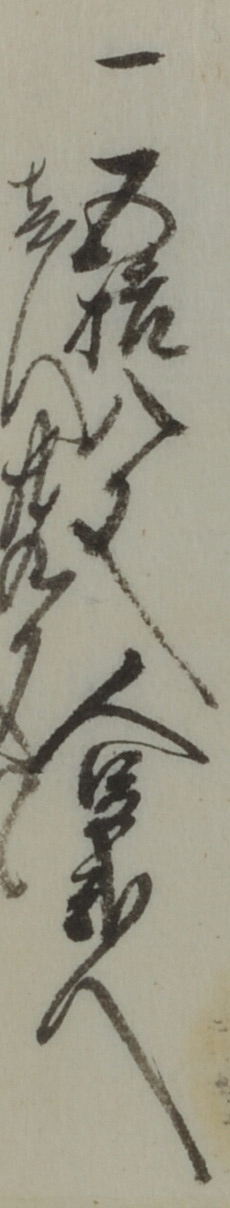一五拾八文人足弐人
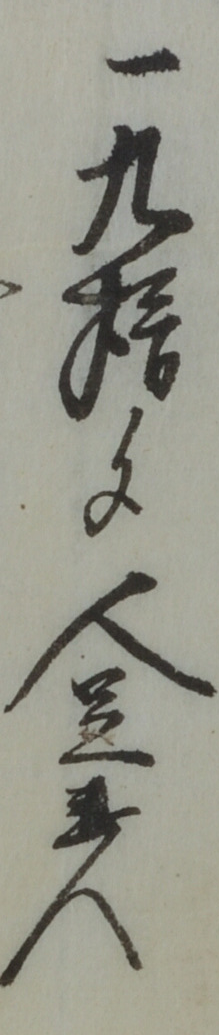一五拾八文人足弐人
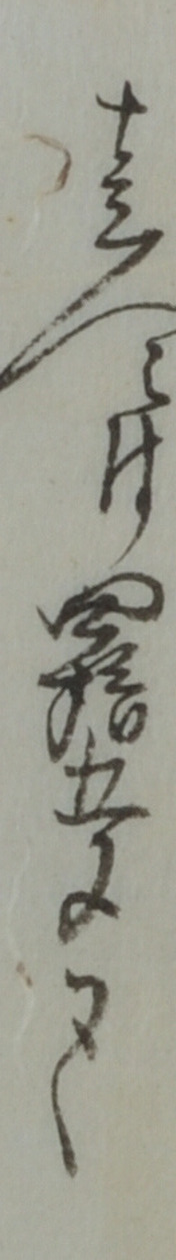壱人ニ付四拾五文ツヽ

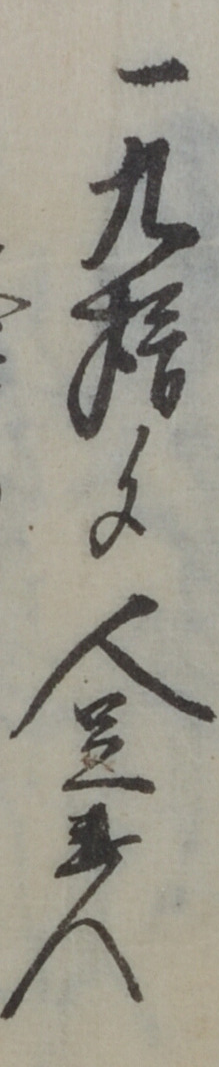一九拾四文人足弐人
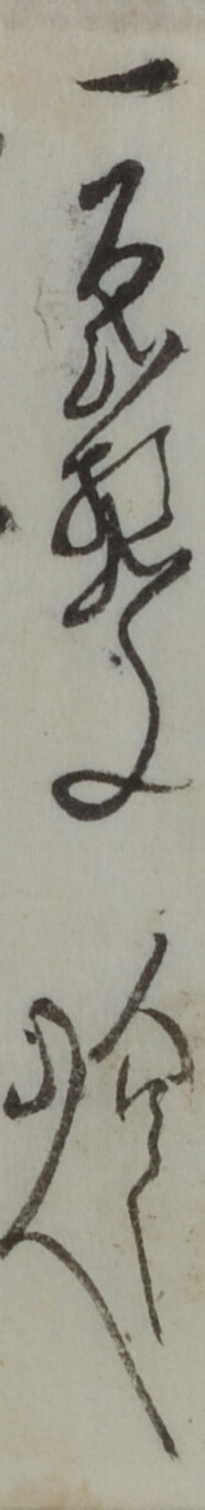一百弐拾八文人足
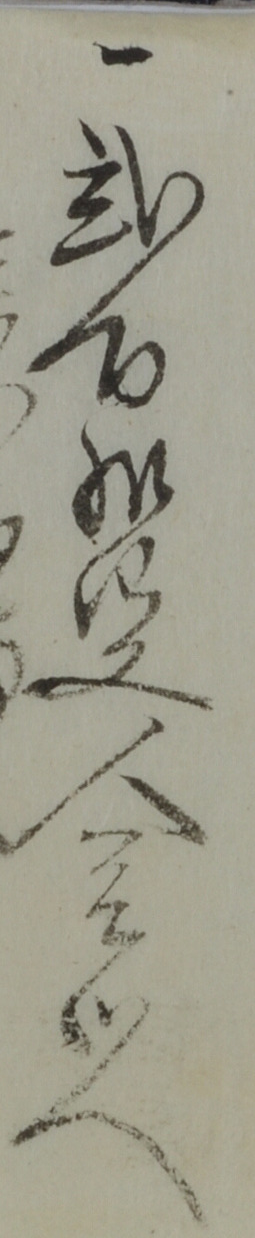一弐百弐四文人足弐人
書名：従信州高遠京都迠人馬駄賃帳
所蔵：伊那市立高遠町図書館・合同会社AMANE
